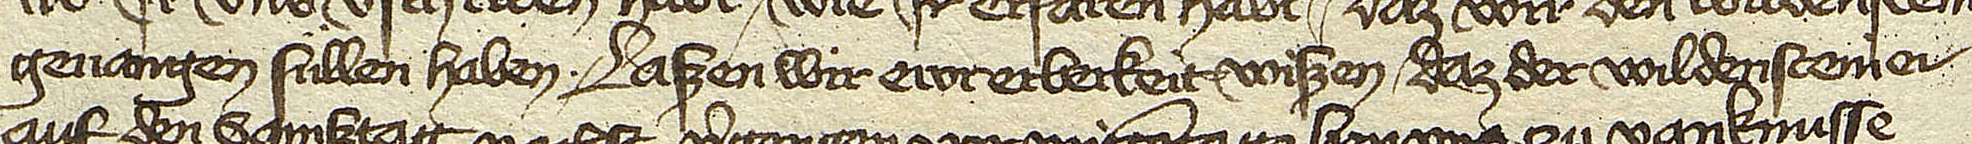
geuangen ſüllen haben . / Laſʒen wir ewr erberkeit wiſʒen / daʒ der wildenſteiner
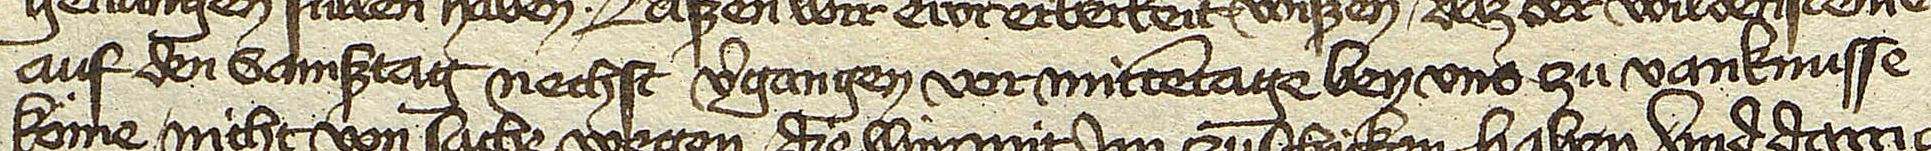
auf den Samſʒtag nechſt v*gangen vor mitte*tage bey vns cʒu vanknuſſe
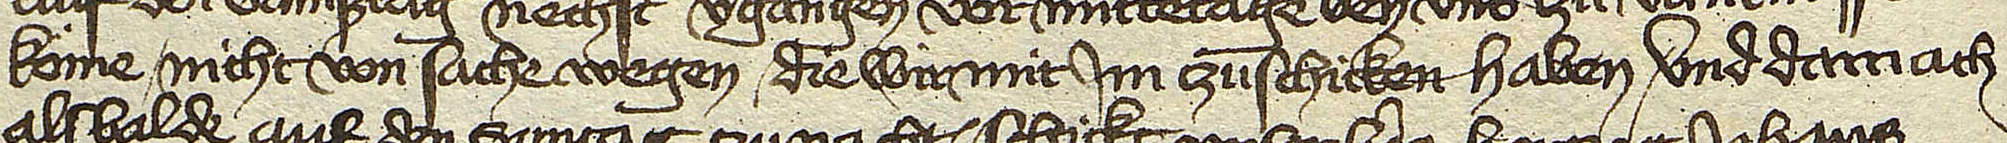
köme / nicht von ſache wegen / die wir mit Im cʒuſchicken haben / Vnd darnach
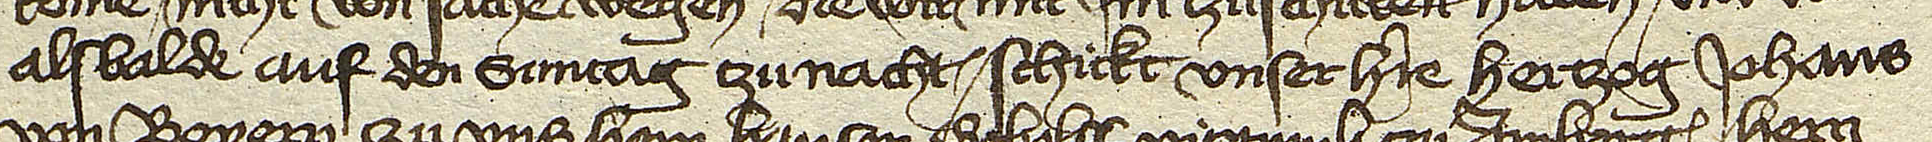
alſbalde auf den Suntag cʒu nacht / ſchickt vnſer h*re hercʒog Iohans
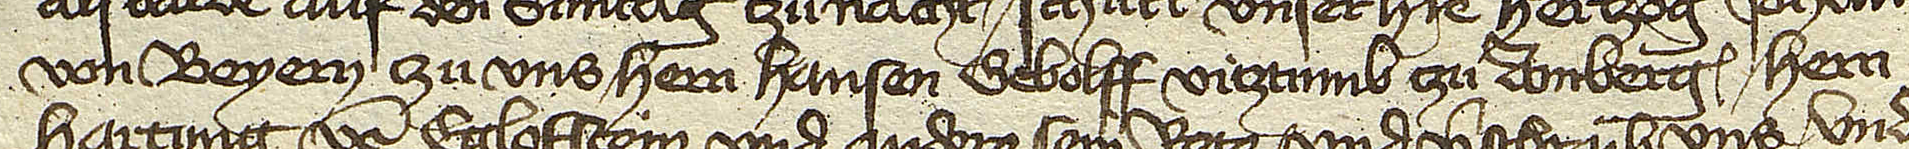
von Beyern cʒu vns hern hanſen Sebolff vicʒtumb cʒu Amberg* / hern
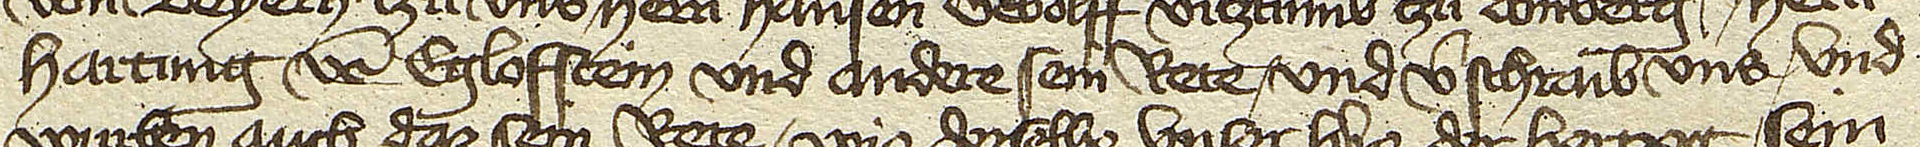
hartung vo* Eglofſtein vnd andere ſein Rete / vnd v*ſchraib* vns / vnd
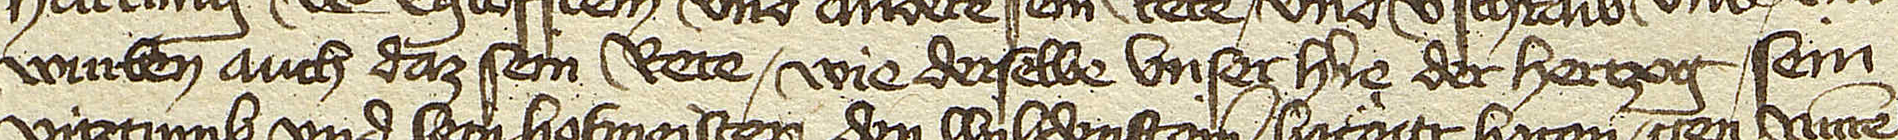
wurben auch daʒ ſein Rete / wie derſelbe vnſer h*re der hercʒog / ſein
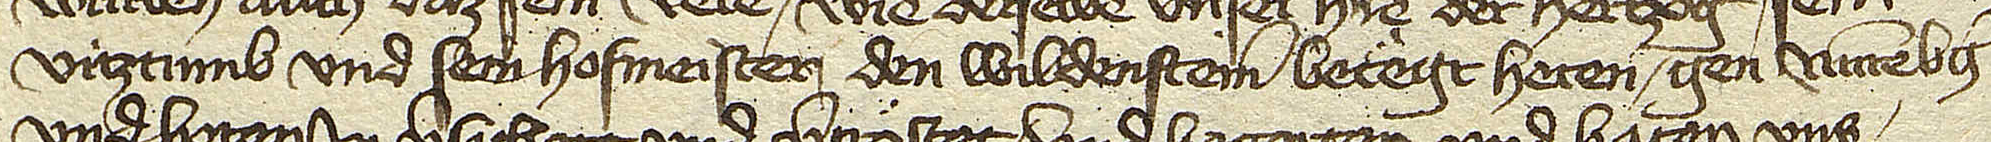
vicʒtumb vnd ſein hofmeiſter den wildenſtein* betëgt heren / gen Nure*bg*
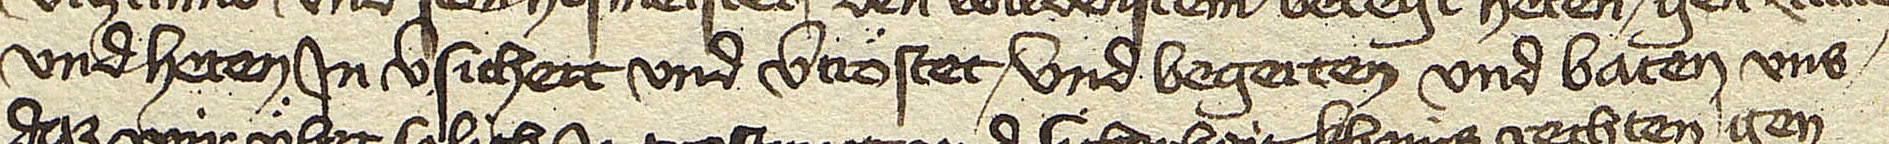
vnd heten In v*ſichert vnd v*tröſtet / vnd begerten vnd baten vns /
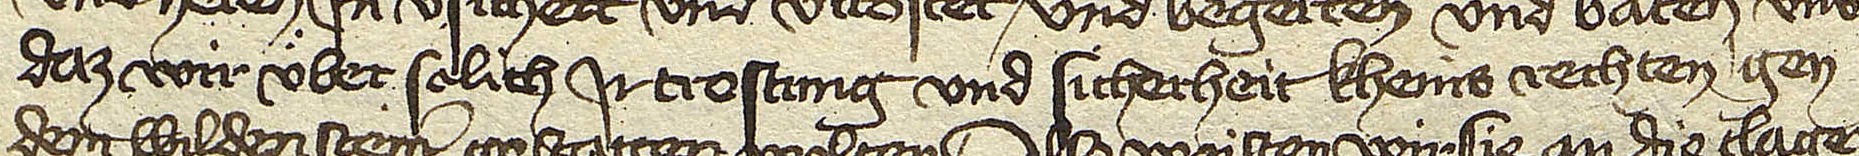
daʒ wir v̈ber ſolich Ir troſtung vnd ſicherheit kheins rechten gen
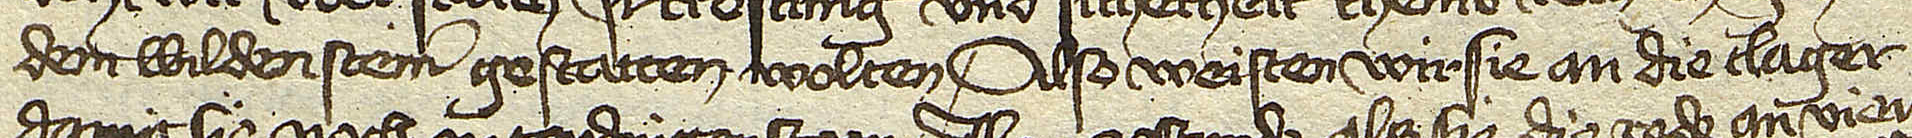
dem wildenſtein* geſtatten wolten / Alſo weiſten wir ſie an die clager
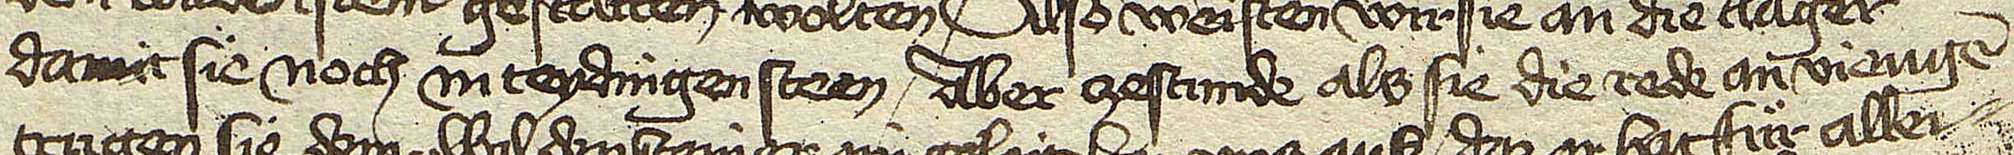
damit ſie noch in teydingen ſteen / Aber cʒeſtunde als ſie die rede anvienge*
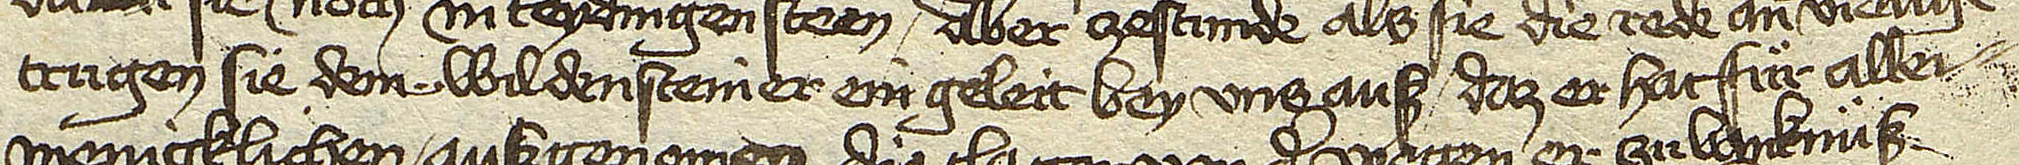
trugen ſie dem ~ wildenſteiner ein geleit bey vns auſʒ / daʒ er hat für aller =
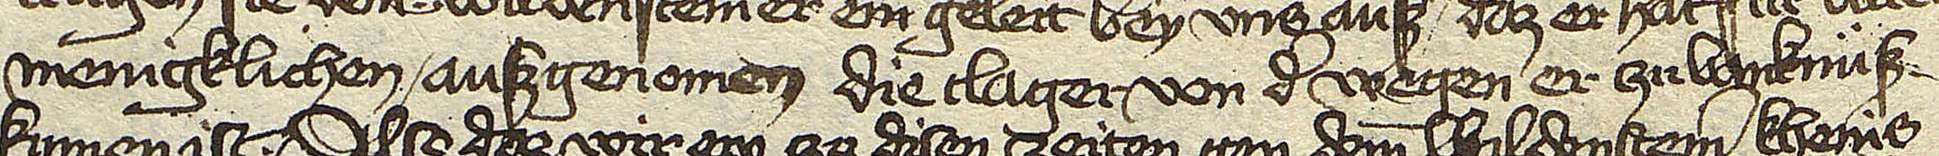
menigklichen / auſʒgenomen die clager von d* wegen er cʒu vanknüſʒ
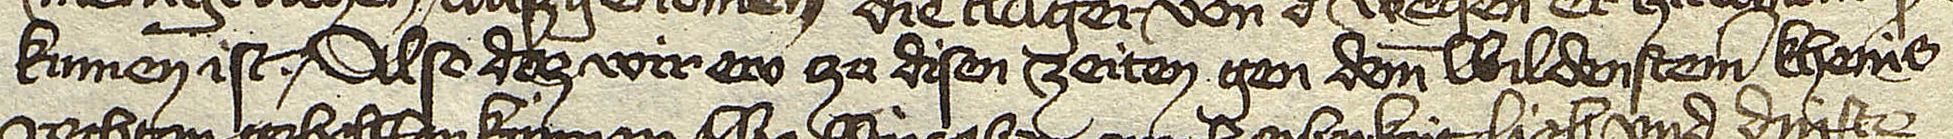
kumen iſt . / Alſo daʒ wir ew cʒu diſen cʒeiten gen dem wildenſtein* kheins
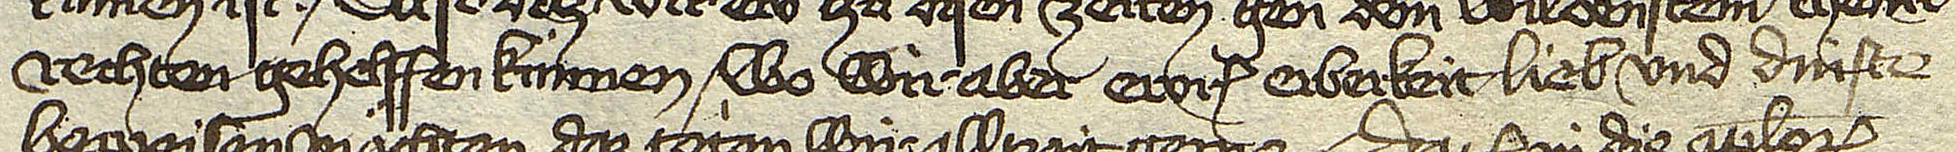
rechten gehelffen künnen / wo wir aber ewr* erberkeit lieb vnd dinſte
